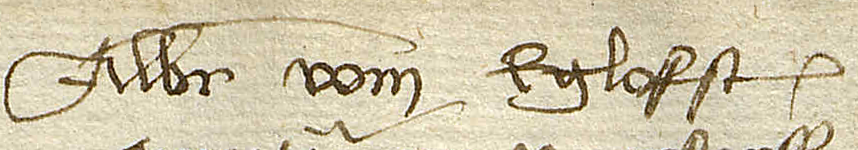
Albr* vom Eglofſt*
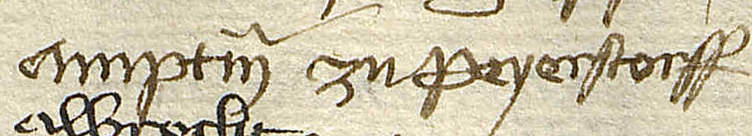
amptm* ʒu Peyerſtorff
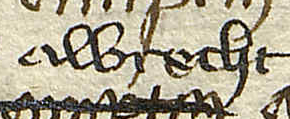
albrecht
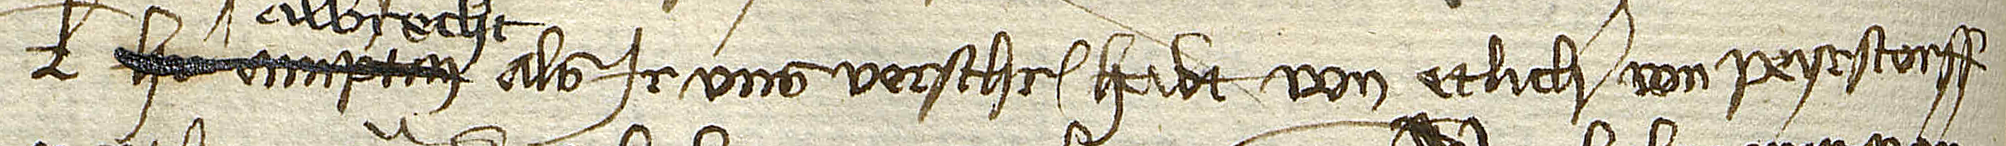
L* h*n amptm* als Ir vns verſchr* habt von etlich* von peyrſtorff
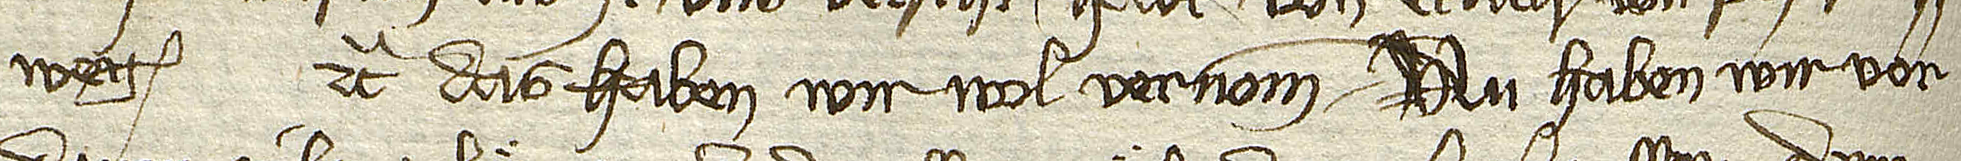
weg* ec* das haben wir wol vernom* / Nu haben wir vor
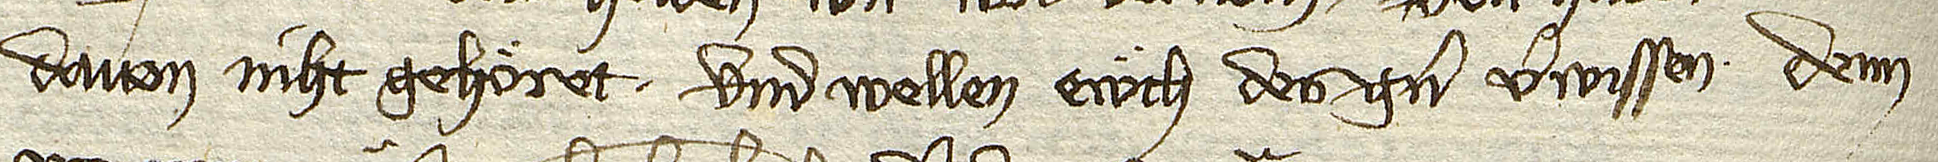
dauon niht gehöret / Vnd wellen ewch des g*n v*wiſſen . Denn
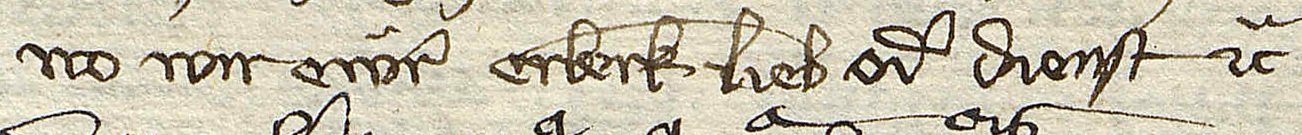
wo wir eẅr* erberk* lieb od* dienſt ec*
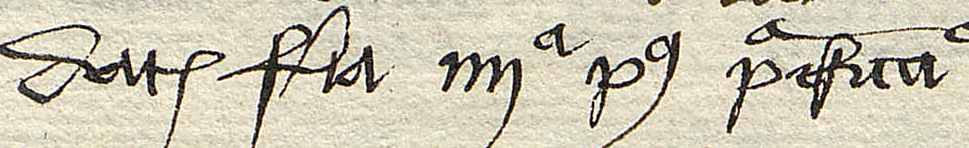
Dat* f*ia iiii* p* p*ifica*
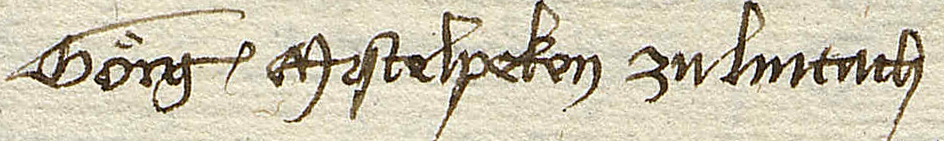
Görg* Miſtelpeken ʒu lintach
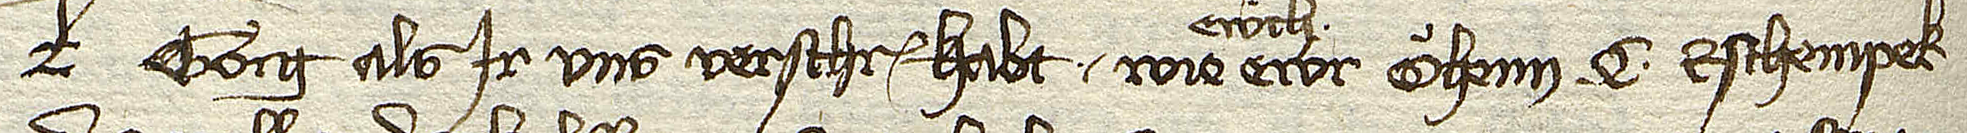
L * Görg als Ir vns verſchr* habt / wie eẅr Öheim C . Eſchempek
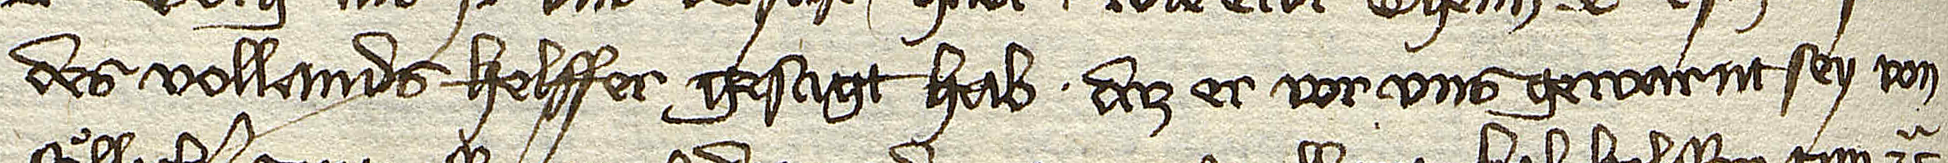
des vollands helffer geſagt hab * daʒ er vns gewarnt ſey von
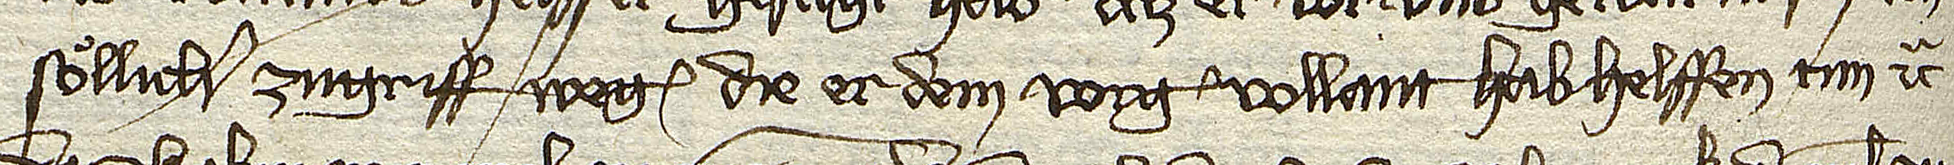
ſöllich* ʒugriff weg* die er dem vorg* vollant hab helffen tun ec*
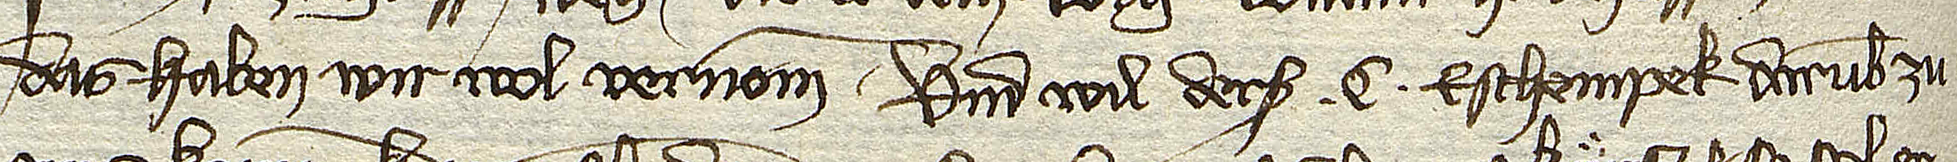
das haben wir wol vernom* / Vnd wil derſ* . C. Eſchempek darub* ʒu
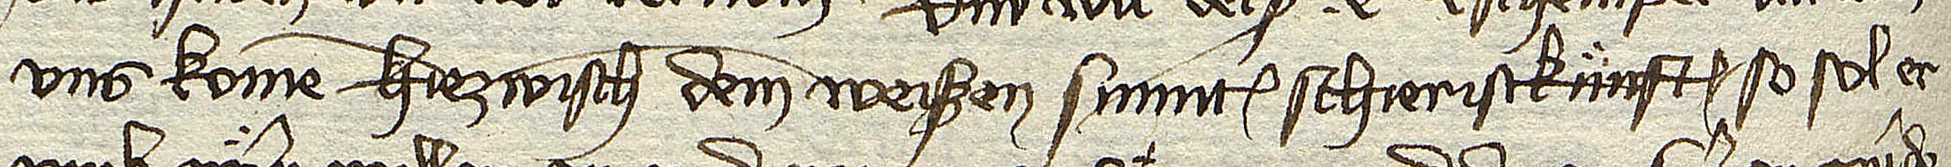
vns kome* hieʒwiſch* dem weiſ*en ſunnt* ſchieriſtkünft* ſo ſol er
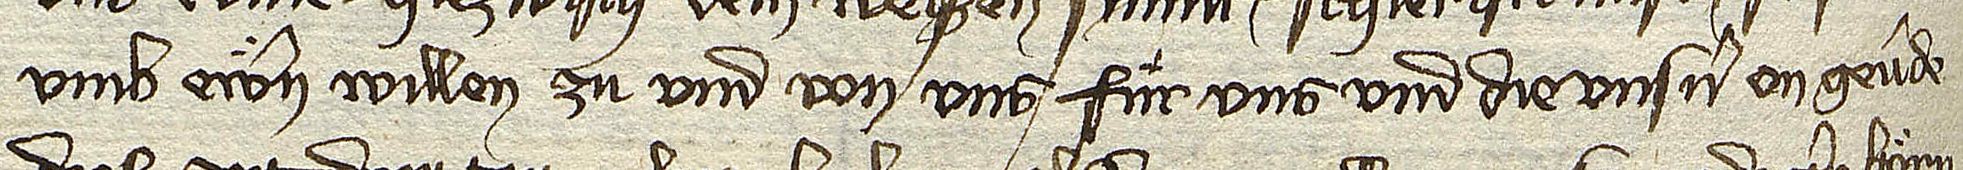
vmb eẅ*n willen ʒu vnd von vns für vns vnd die vnſ*n on geu*de
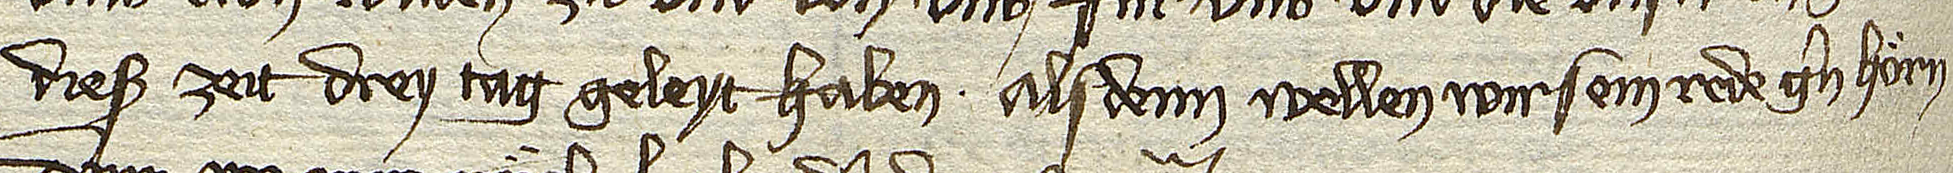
dieſ* ʒeit drey tag geleyt haben . alſdenn wellen wir ſein rede g*n hör*n
